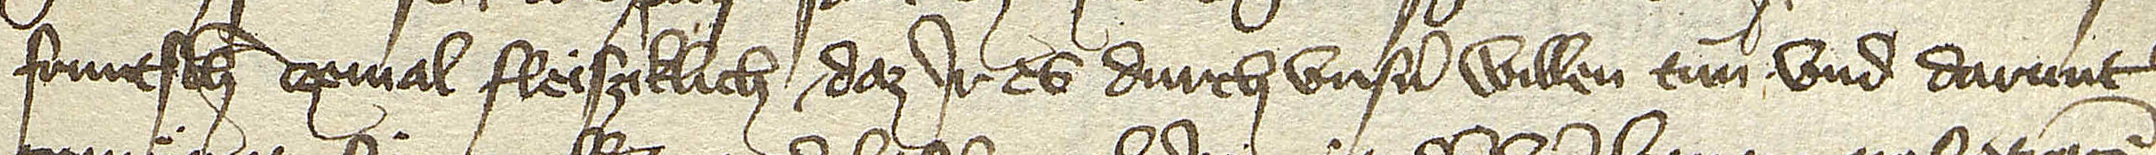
fruntſch* cʒemal fleiſʒiklich / daʒ Ir es durch vnſn* willen tün vnd darunt*
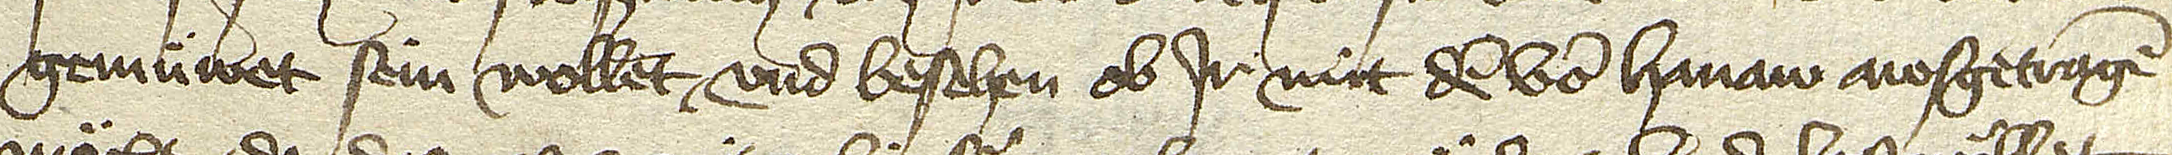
gemüwet ſein wollet / vnd beſehen ob Ir mit d* vo* hanaw awſgetrage*
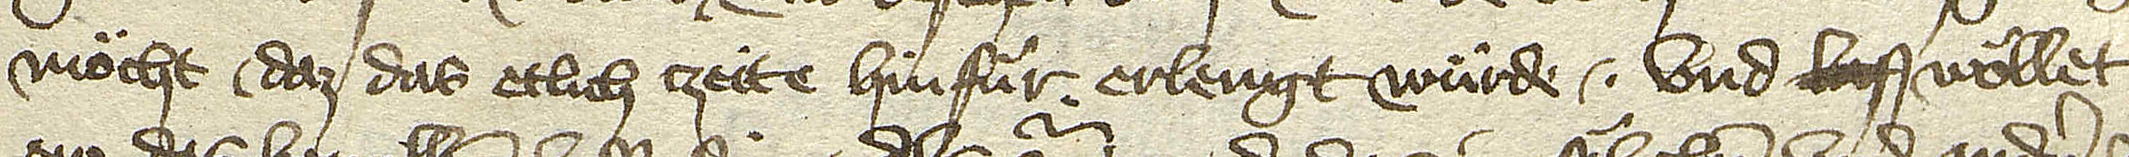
möcht / daʒ das etlich cʒeite hinfür erlengt würd / . vnd laſſ wöllet
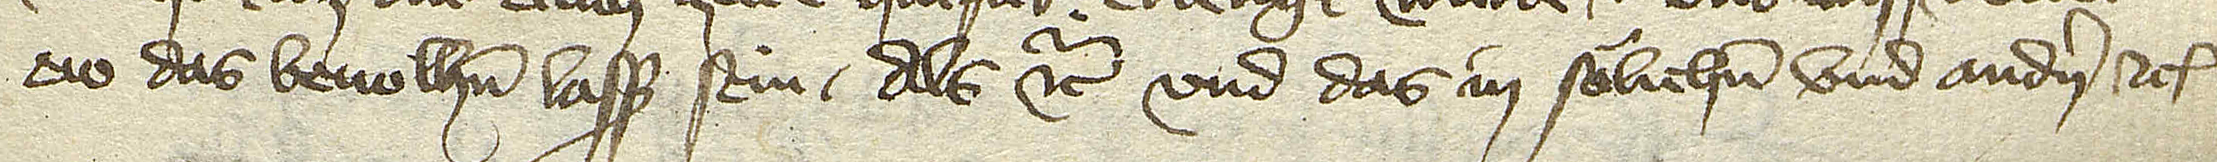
ew das beuolhn* laſſ* ſein / Als ec* vnd das in ſölichn* vnd andn* ec*
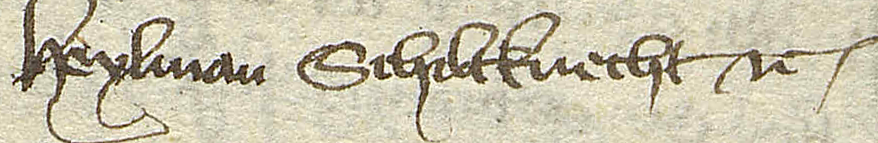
heylman Schiltknecht ec*
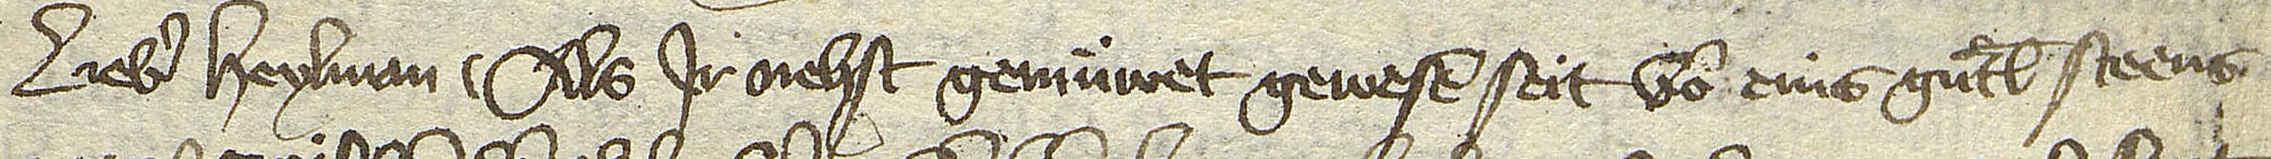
Lieb* Heylman / Als Ir nehſt gemüwet geweſe* ſeit vo* eins gütl* ſteens
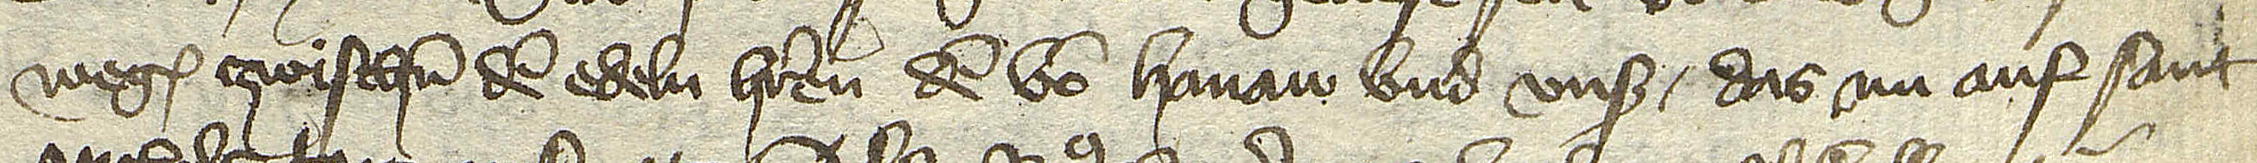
weg* cʒwiſchn* d* edeln hr*en d* vo* hanaw vnd vnſ* / das nu auf ſant
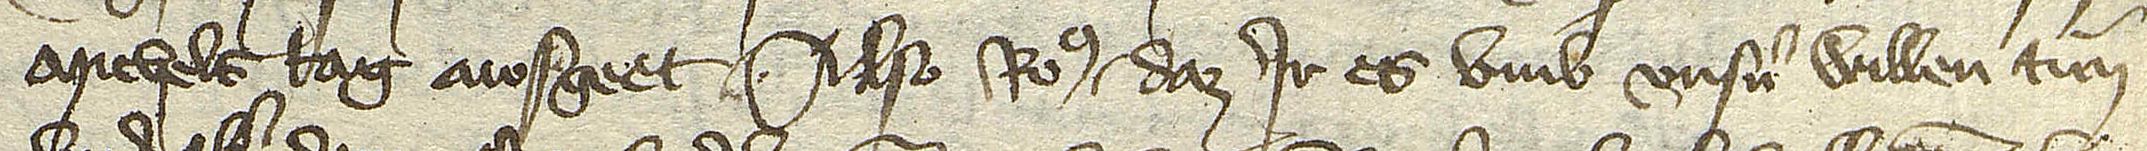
Michels tag awſgeet / . Alſo Ro* / daʒ Ir es vmb vnſn* willen tün
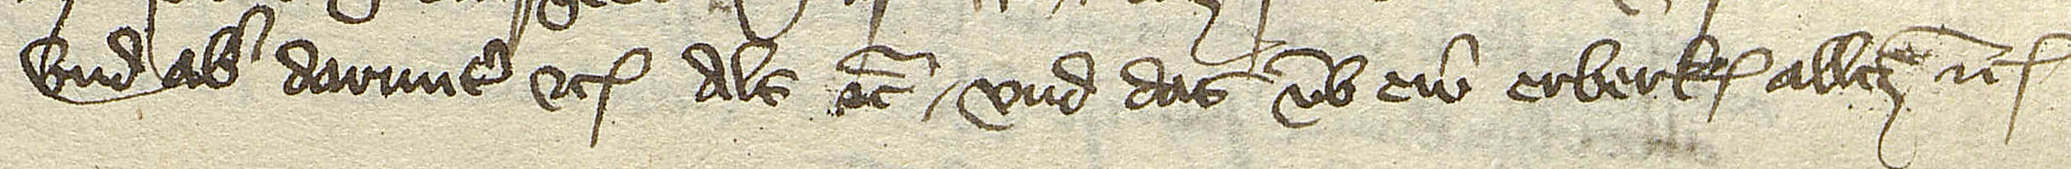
vnd ab* darunt* ec* Als ec* / vnd das vb* ew* erberk* allcʒ* ec*
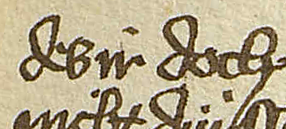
des ir doch
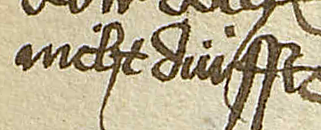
nicht dürfft
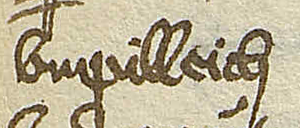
vnpilleich
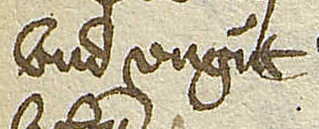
vnd vngüt
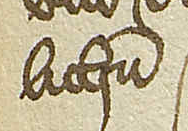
lichn*
